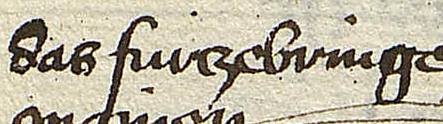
das furcʒebringen
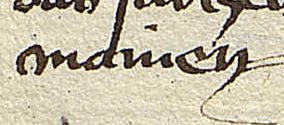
mainen
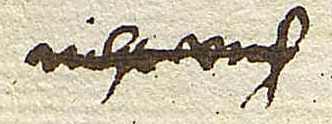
niht vnſ*
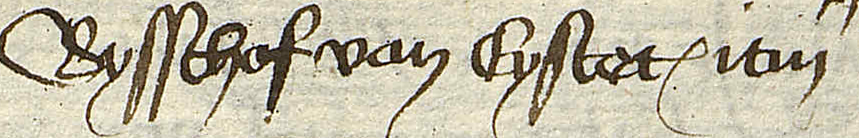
Byſſchof von Eyſtet* it*m
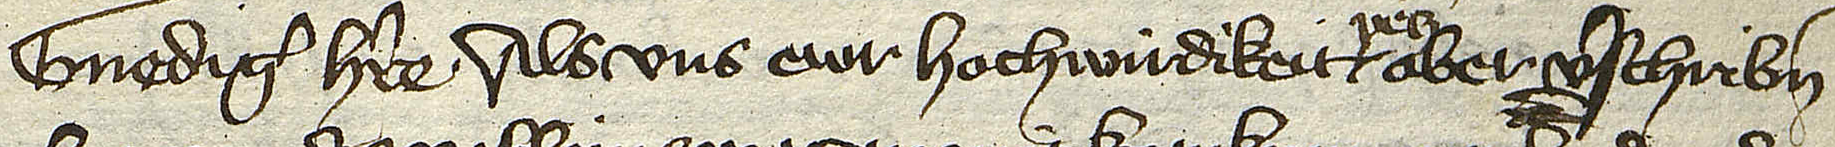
Gnedig* h*re . Als vns ewr hochwirdikeit aber v*ſchrib*n
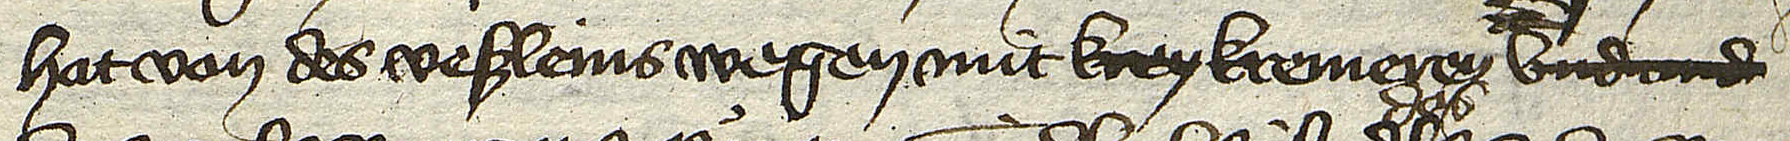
hat von des veſʒleins wegen mit krey kremerey vnd and
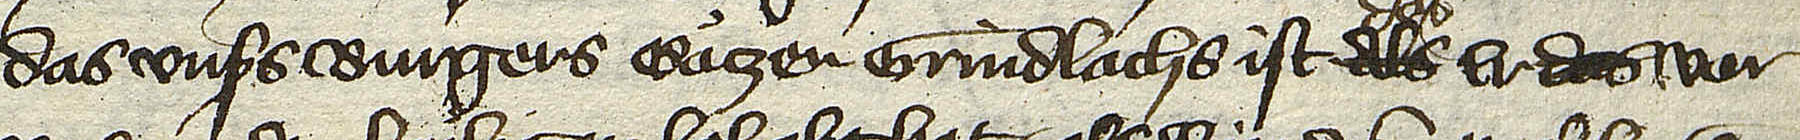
das vnſ*s Burgers Göcʒen Grindlachs iſt Als Er das vor
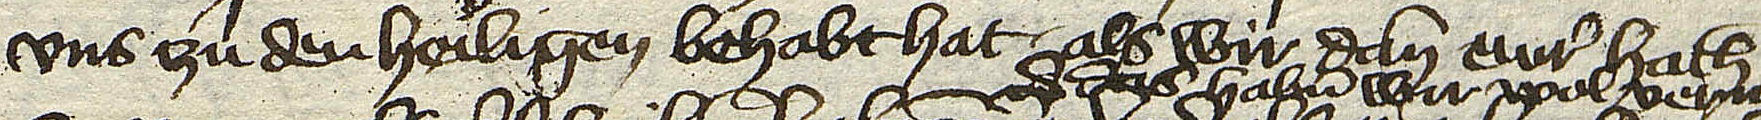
vns cʒu den heiligen behabt hat / als wir dan* ew*r hoch*
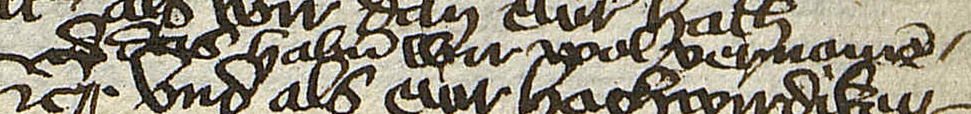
das hab*n wir wol vernome*
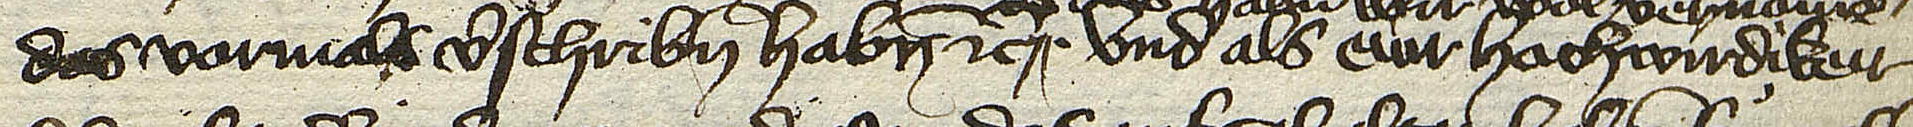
das vormals v*ſchrib*n hab*n ec* . Vnd als ewr hochwirdikeit
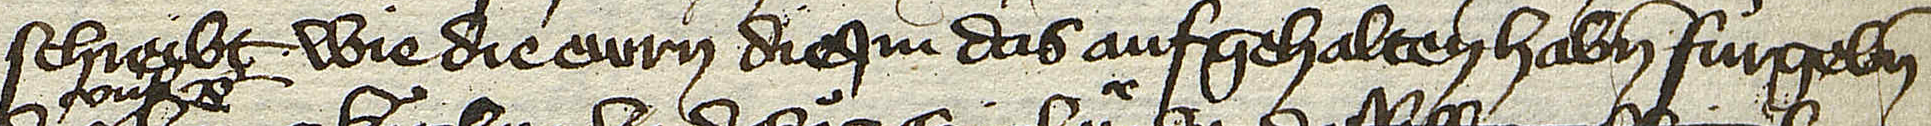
ſchreibt . Wie die ewrn die Im das aufgehalten hab*n fürgeb*n
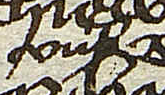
vnſ* B*
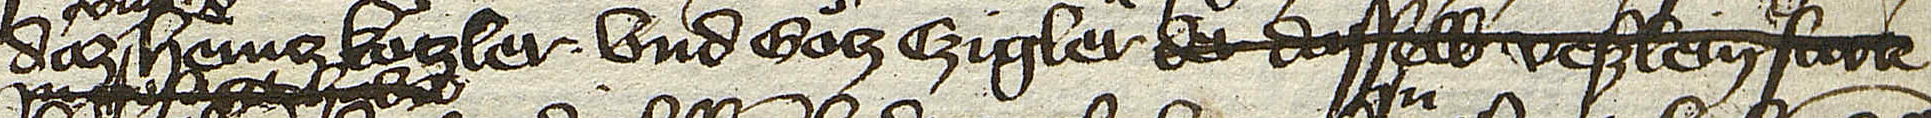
daʒ Heincʒ köcʒler . vnd Göcʒ Cʒigler der daſſelb veſʒlein fürte
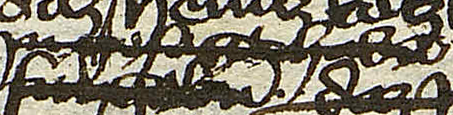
In geſagt hab*n
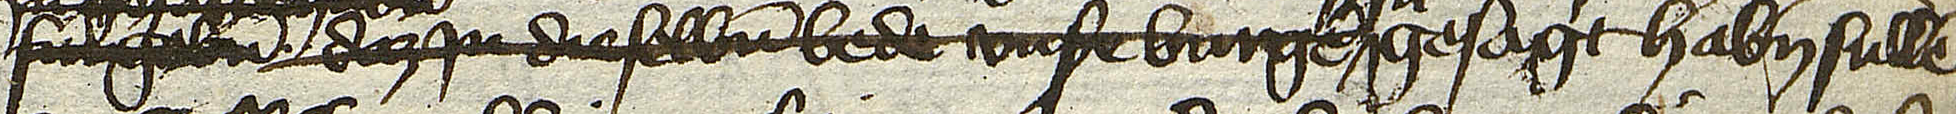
fürgeb*n . daʒ In dieſelb*n bede vnſ*e burge* geſagt hab*n ſulle*
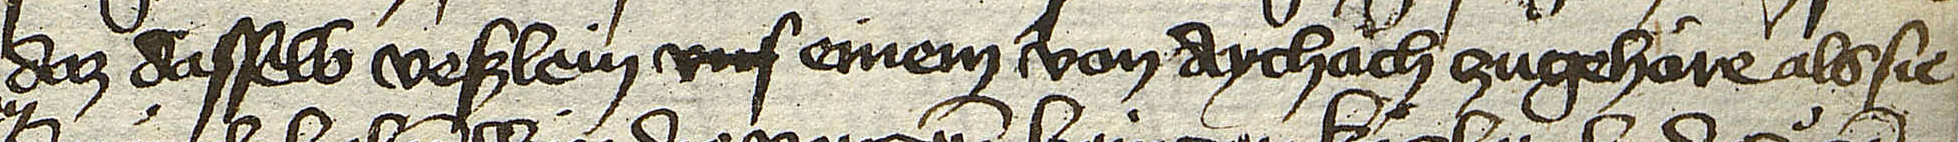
daʒ daſſelb veſʒlein vnſ einem von Aychach cʒugehöre als ſie
